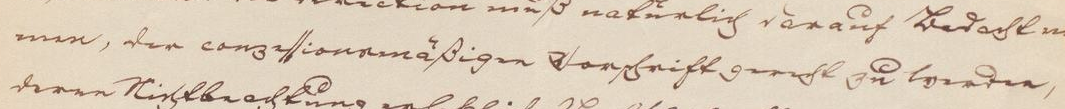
men, der conzessionsmäßigen Vorschrift gerecht zu werden,
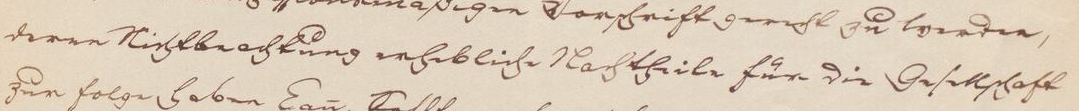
deren Nichtbeachtung erhebliche Nachtheile für die Gesellschaft
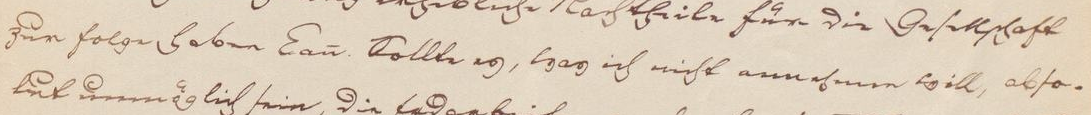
zur Folge haben kann. Sollte es, was ich nicht annehmen will, abso-
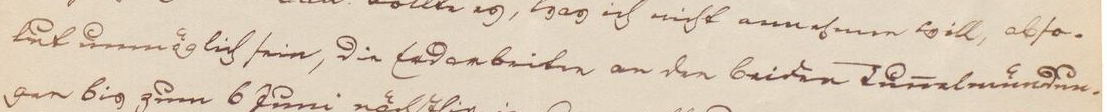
lut unmöglich sein, die Erdarbeiten an den beiden Tunnelmündun-
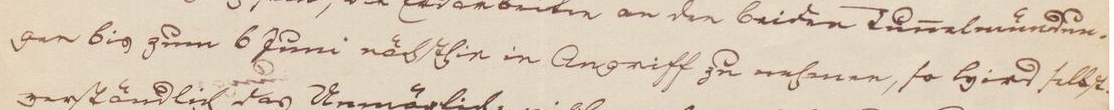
gen bis zum 6. Juni nächsthin in Angriff zu nehmen, so wird selbst-
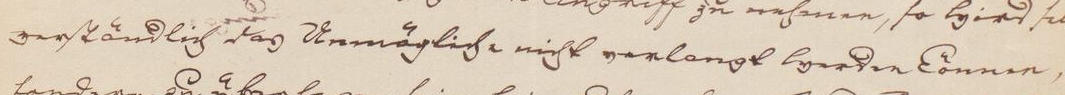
verständlich das Unmögliche nicht verlangt werden können,
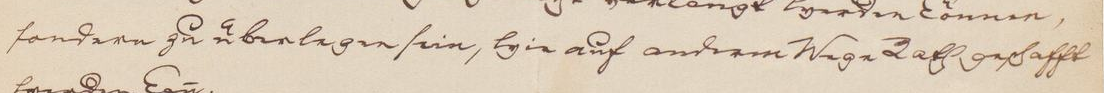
sondern zu überlegen sein, wie auf anderm Wege Rath geschafft
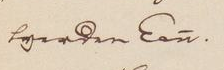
werden kann.
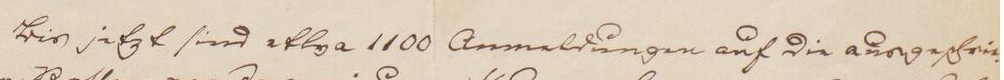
Bis jetzt sind etwa 1100 Anmeldungen auf die ausgeschrie-
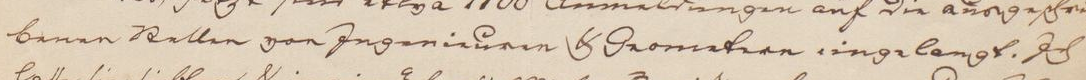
benen Stellen von Ingenieuren & Geometern eingelangt. Ich
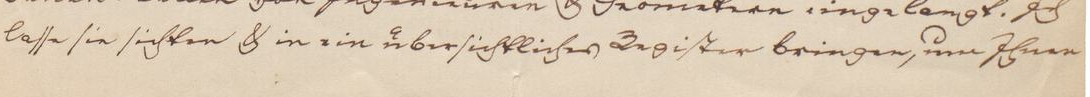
lasse sie sichten & in ein übersichtliches Register bringen, um Ihnen
